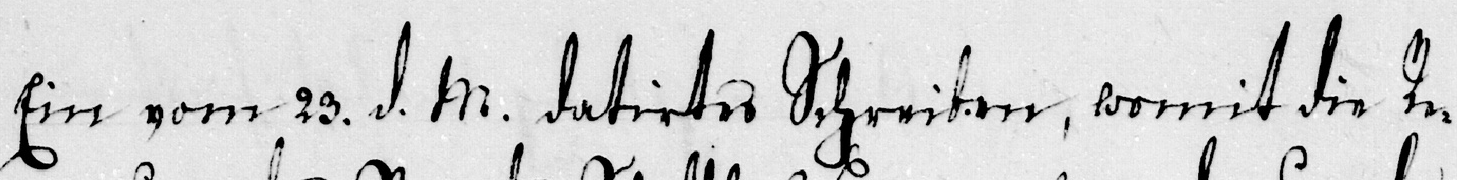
Ein vom 23. d. M. datirtes Schreiben, womit die R¬
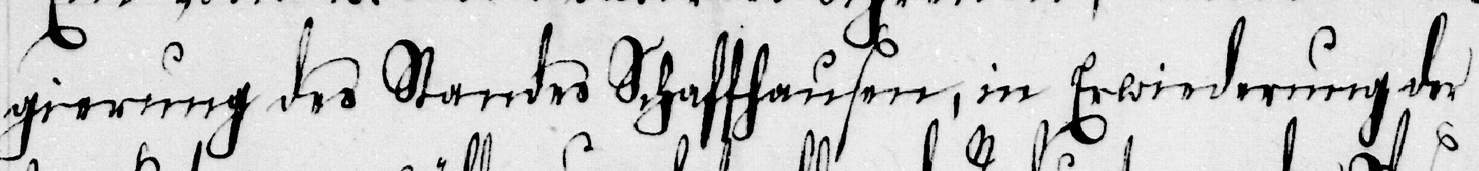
egierung des Standes Schaffhausen, in Erwiederung der
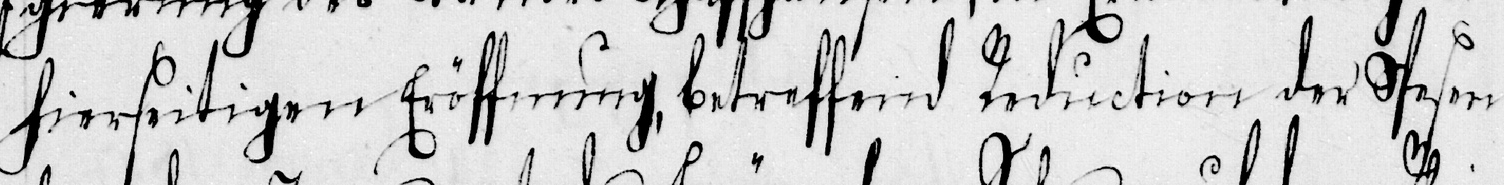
hierseitigen Eröffnung, betreffend Reduction der Spesen
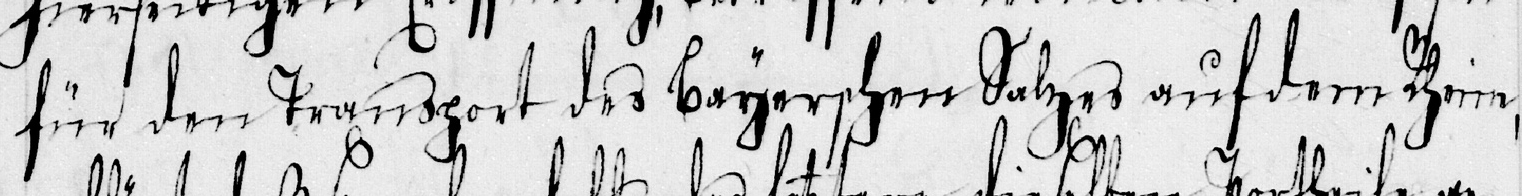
für den Transport des Bayerschen Salzes auf dem Rheine,
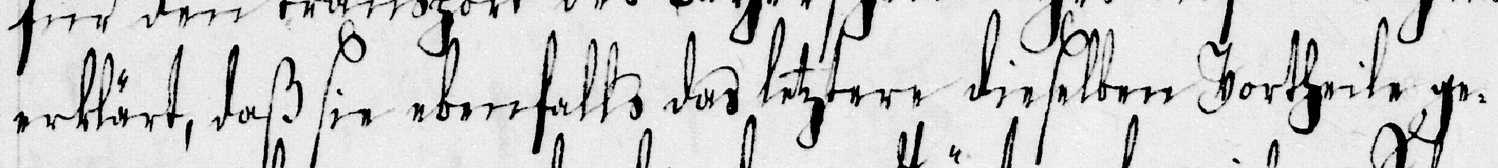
erklärt, daß sie ebenfalls das letztere dieselben Vortheile ge¬
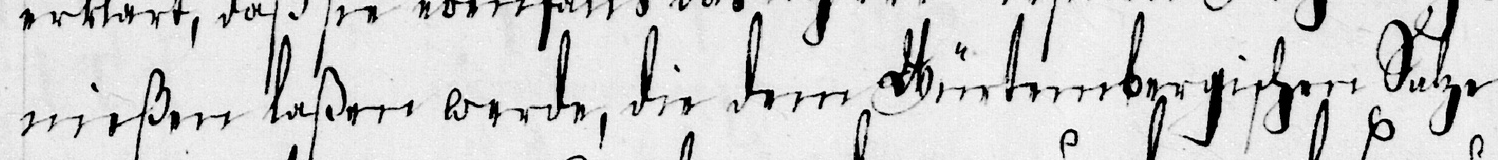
nießen laßen werden, die dem Würtembergischen Salze
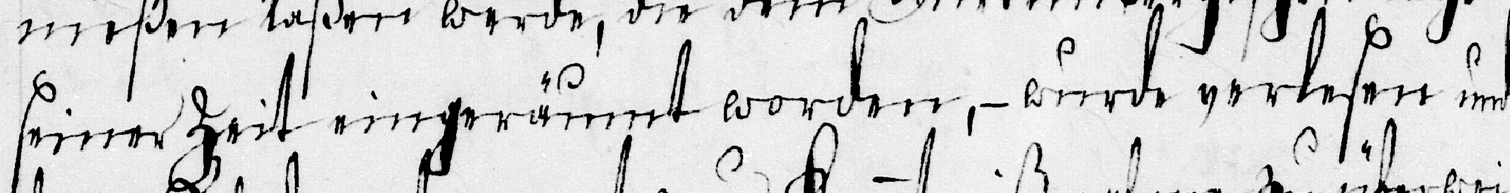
seiner Zeit eingeräumt worden,– wurde verlesen und
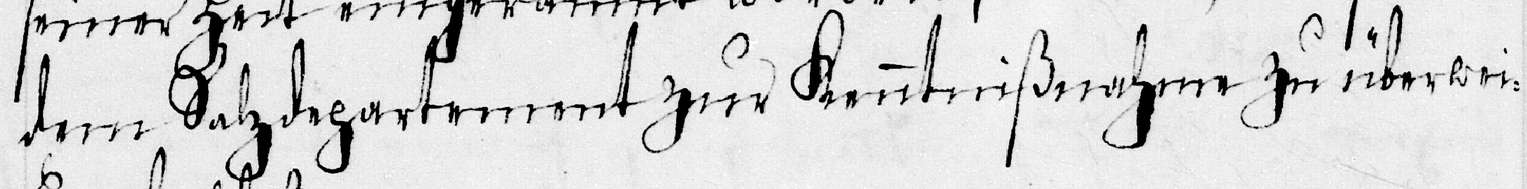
dem Salzdepartement zur Kenntnißnahme zu überwei¬
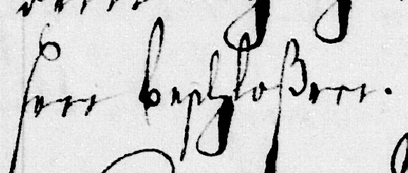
sen beschloßen.
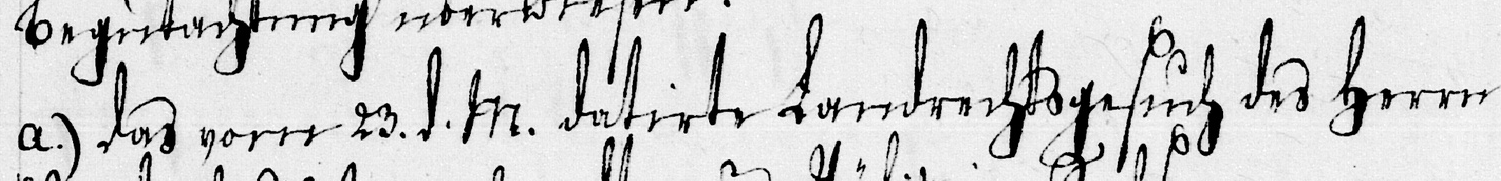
a.) das vom 23. d. M. datirte Landrechtsgesuch des Herrn
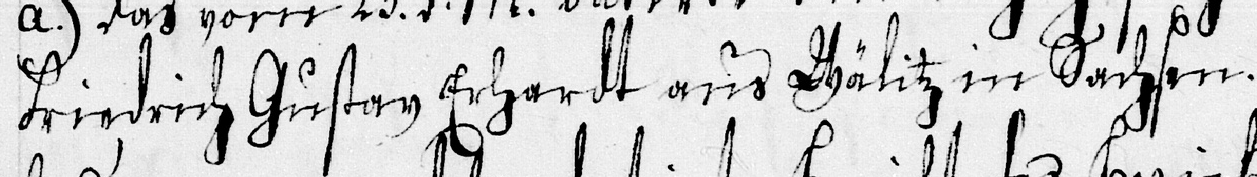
Friedrich Gustav Erhardt aus Wäliz in Sachsen.
